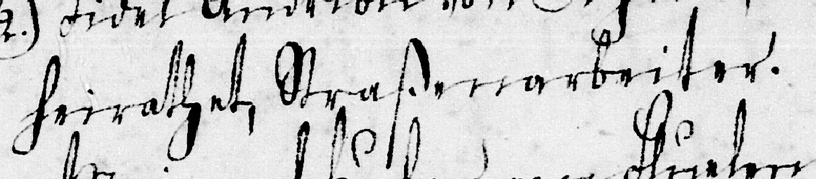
heirathet, Straßenarbeiter.
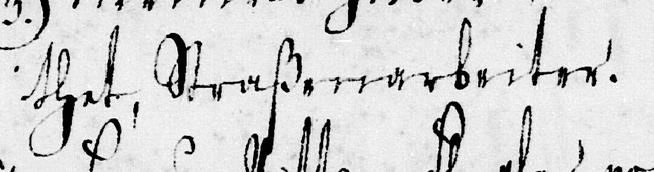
thet, Straßenarbeiter.
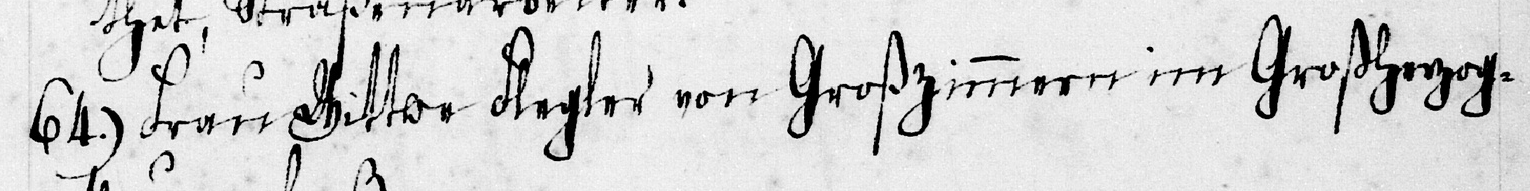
64.) Frau Wittwe Flegler von Großzimmern im Großherzog¬
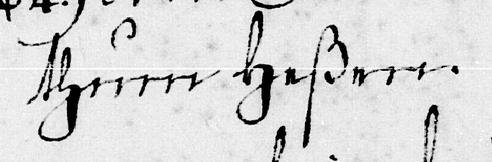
thum Heßen.
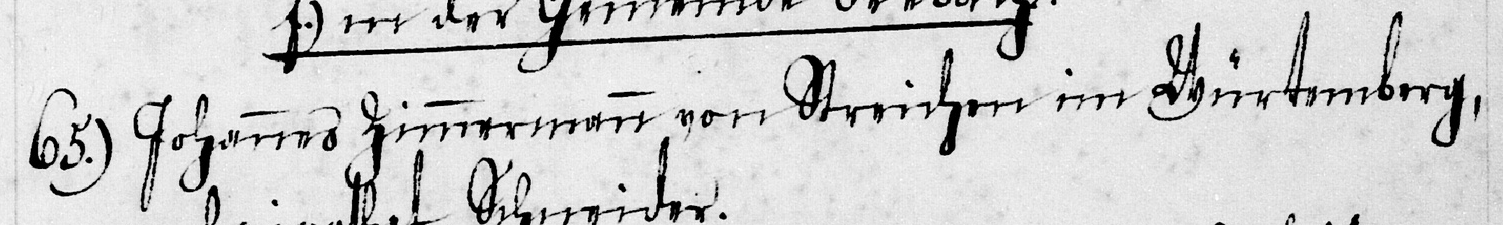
65.) Johannes Zimmermann von Streichen im Würtemberg,
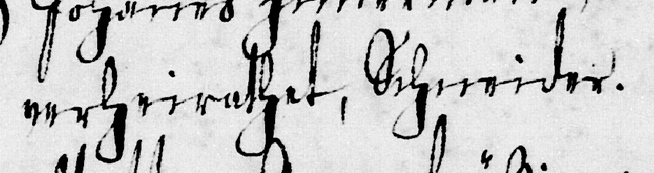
verheirathet, Schneider.
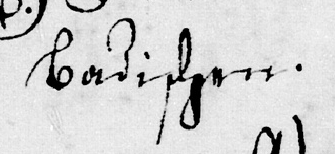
Badischen.
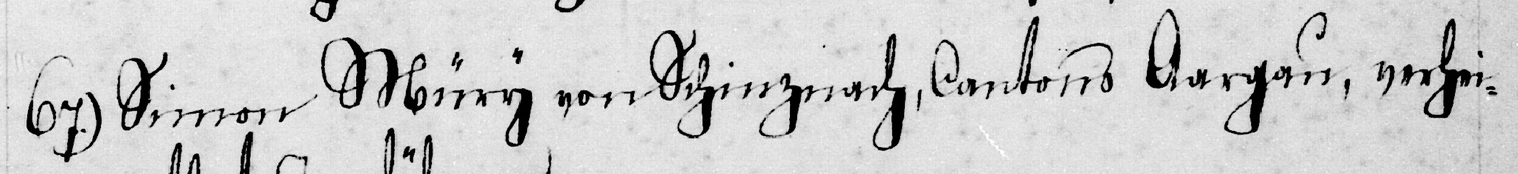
67.) Simon Müry von Schinznach, Cantons Aargau, verhei¬
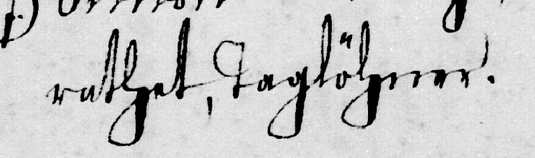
rathet, Taglöhner.
